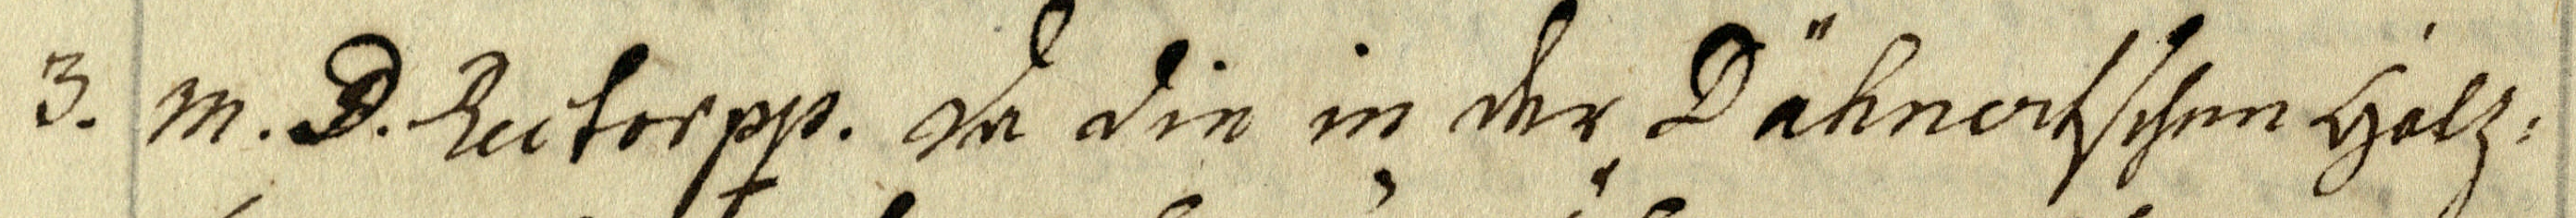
3, M. D. Rector pp. Da die in der Dähnertschen Holz¬
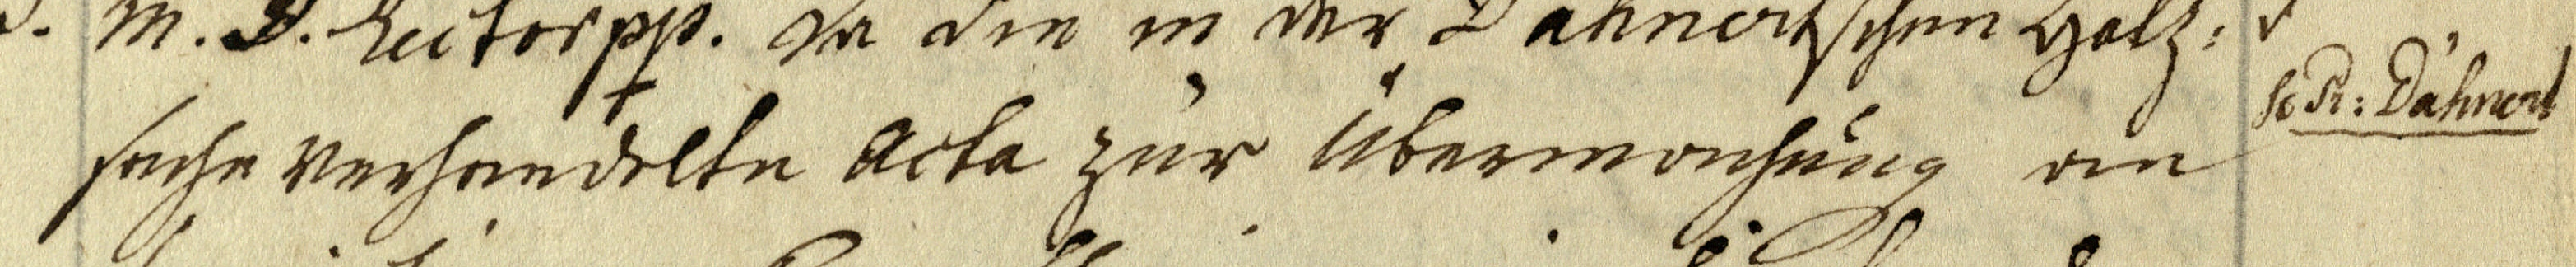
sache verhandelte acta zur Übermachung an h. Pr. Dähnert
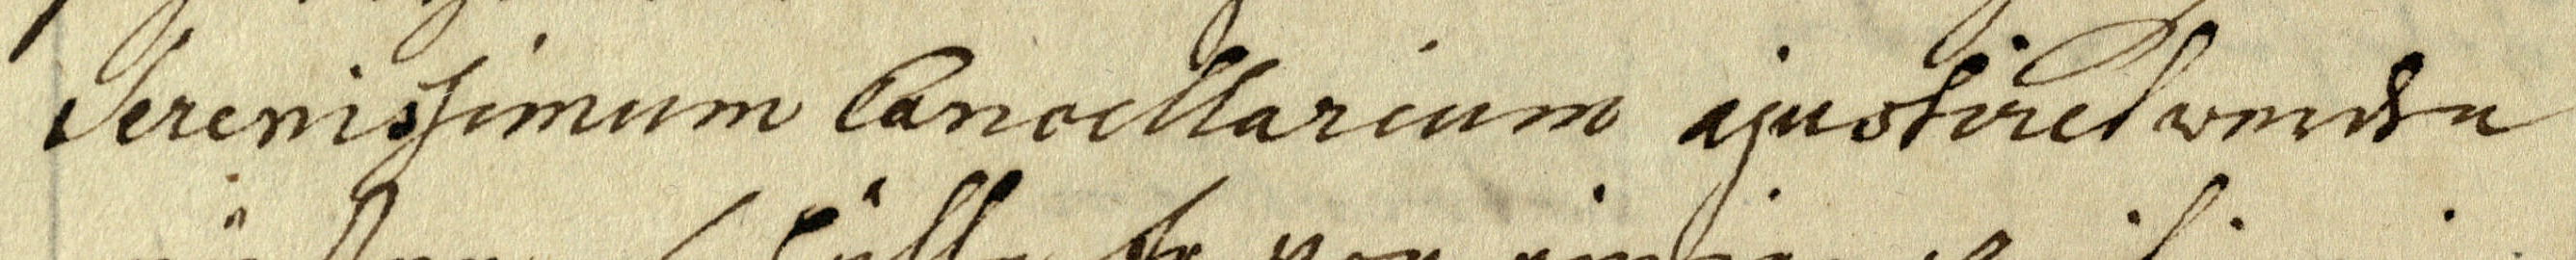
Serenissimum Cancellarium ajustiret werden
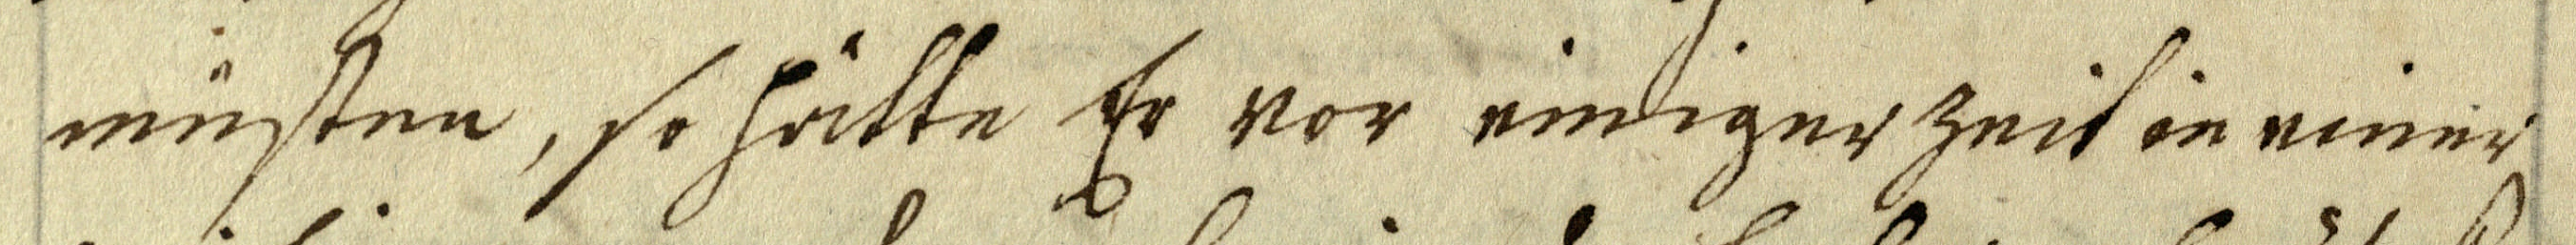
müsten, so hätte Er vor einiger Zeit in einer
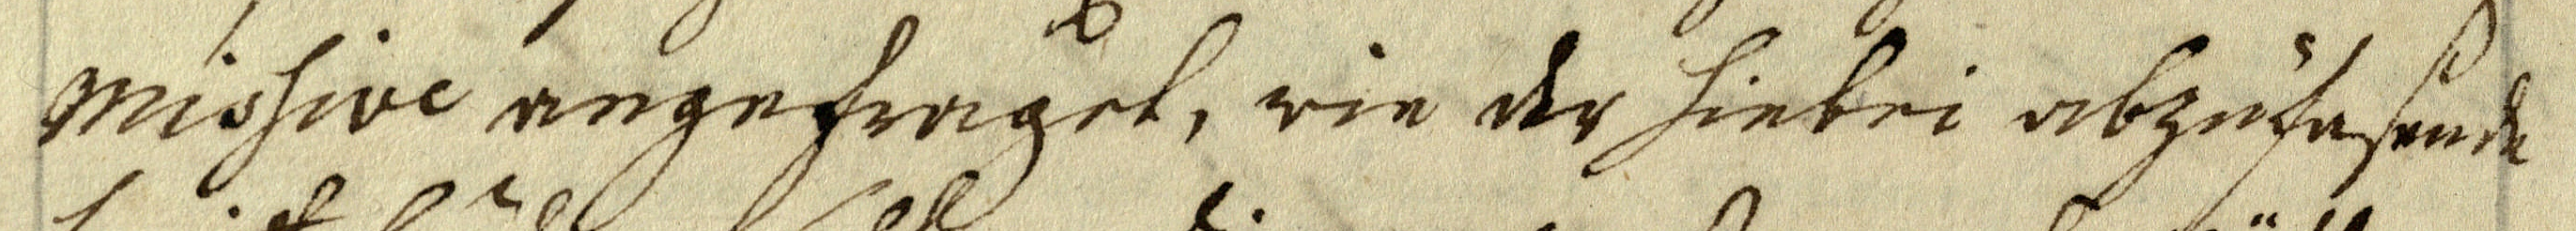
missive angefraget, wie der hiebei abzufaßende
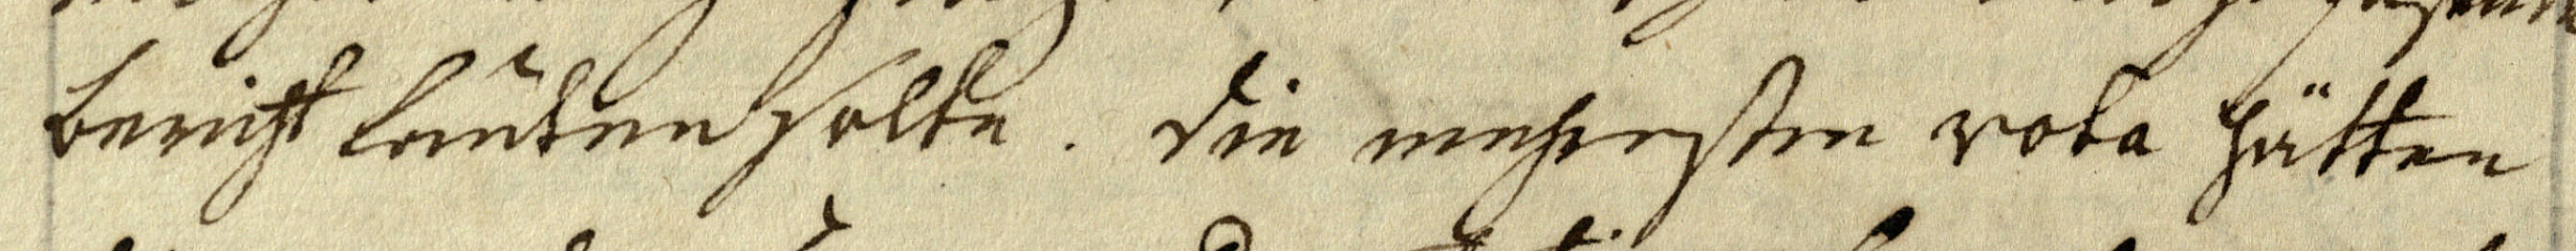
Bericht lauten solte. die mehersten vota hätten
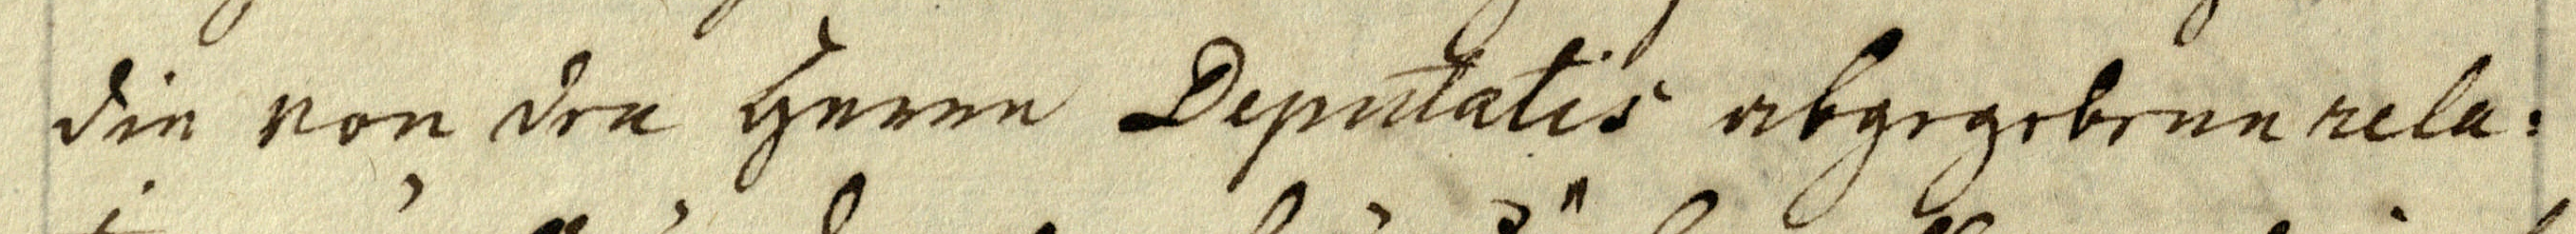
die von den Herrn Deputatis abgegebene rela¬
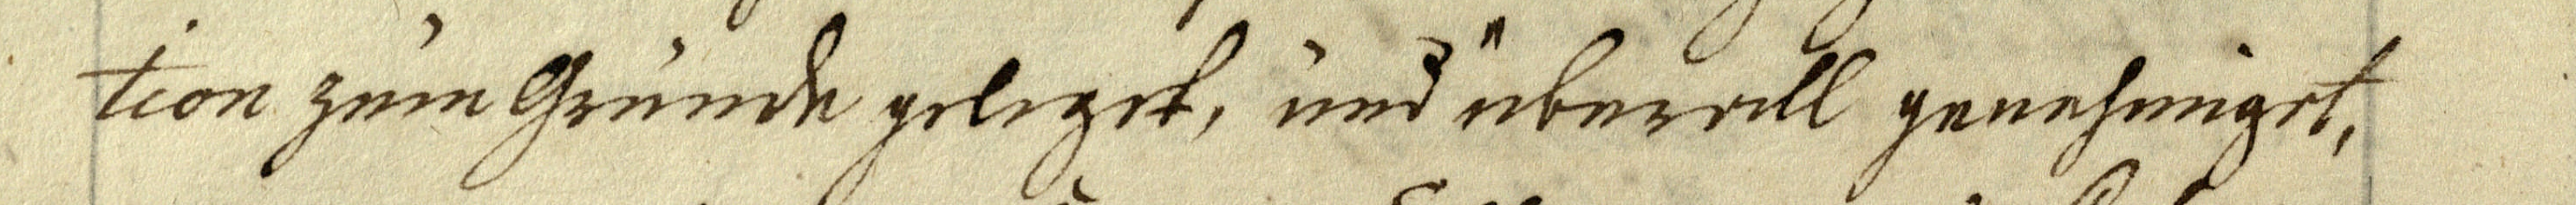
tion zum Grunde geleget, und überall genehmiget,
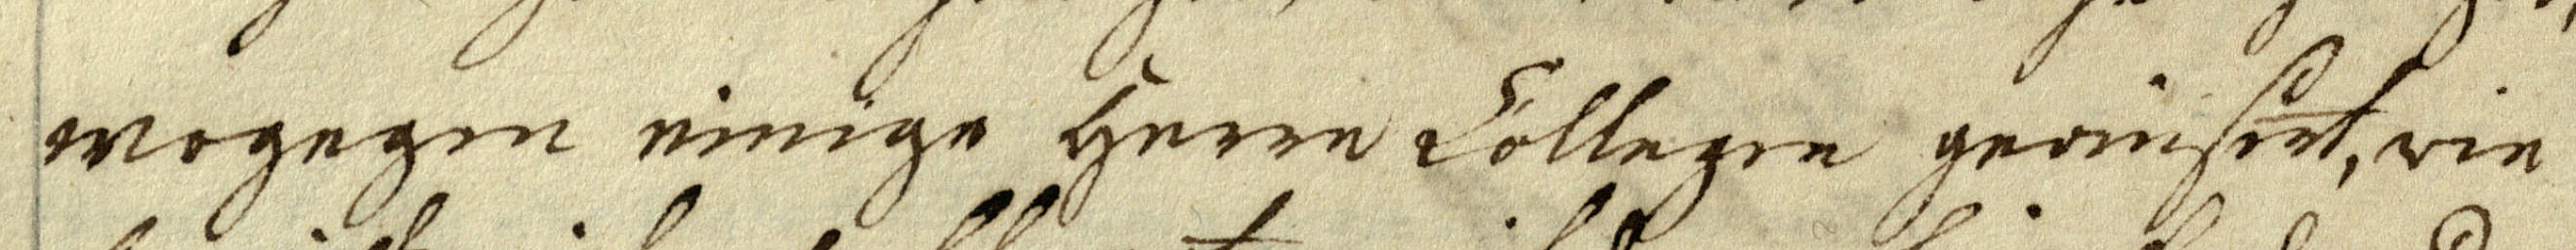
wogegen einige Herrn Collegen geäußert, wie
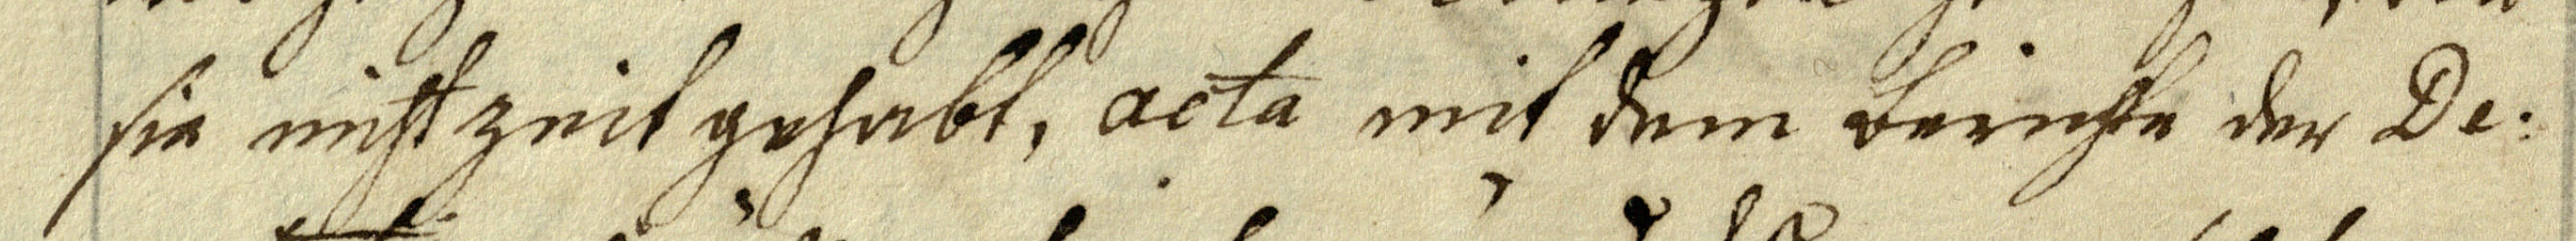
sie nicht zeit gehabt, acta mit dem Berichte der De¬
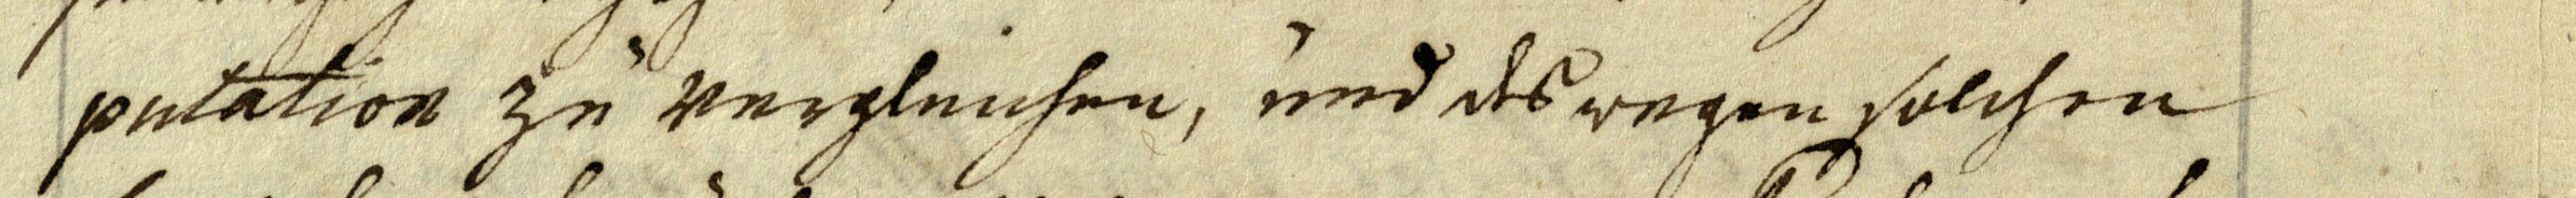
putation zu vergleichen, und deswegen solchen
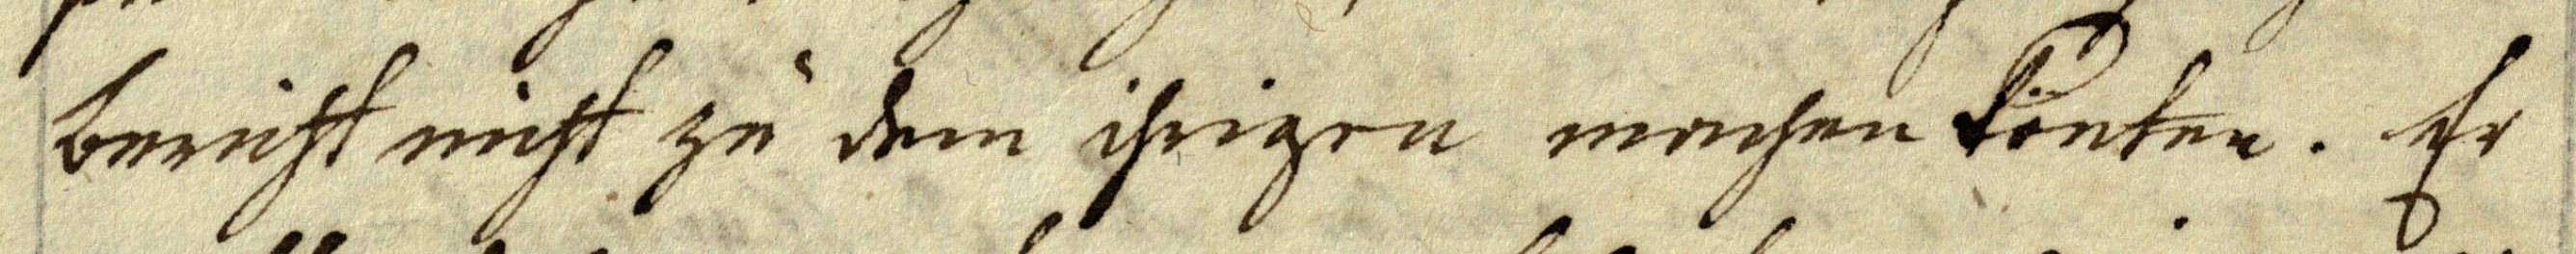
Bericht nicht zu dem ihrigen machen könten. Er
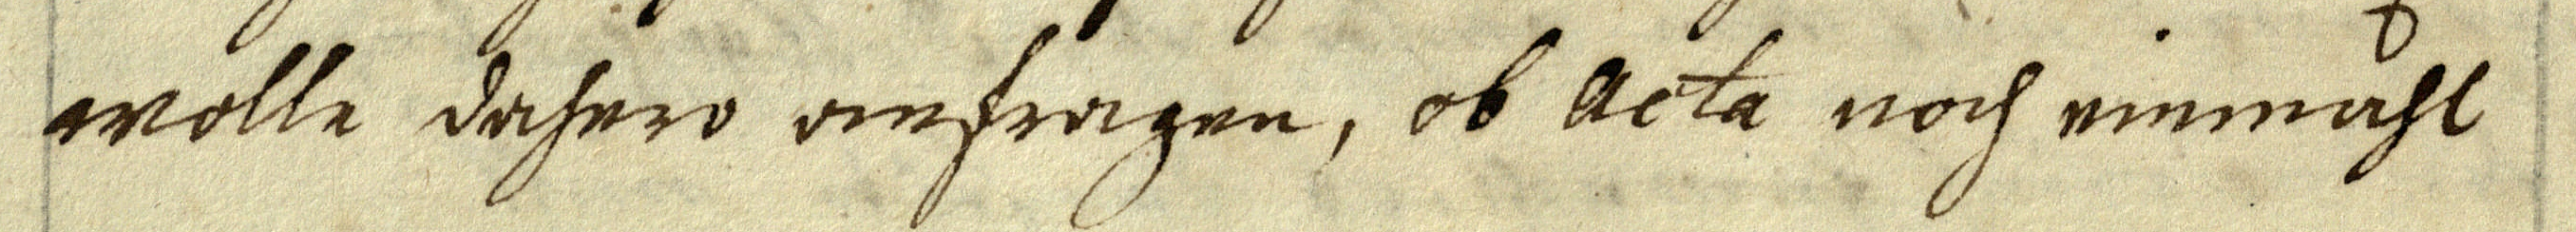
wolle dahero anfragen, ob acta noch einmahl
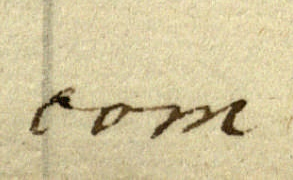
com
